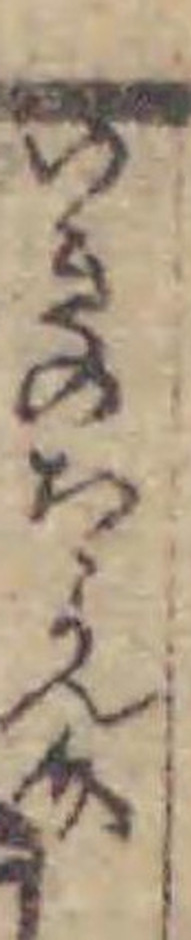いきのちよん介
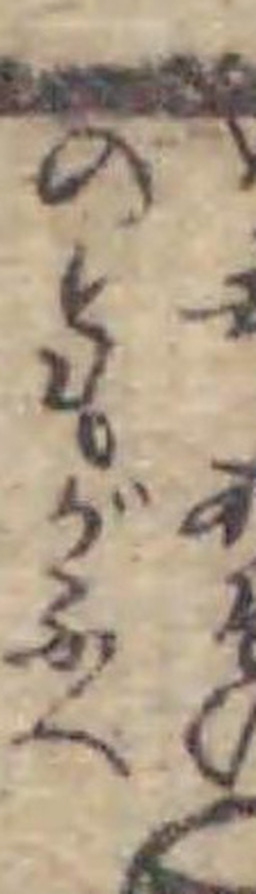のともがふへ
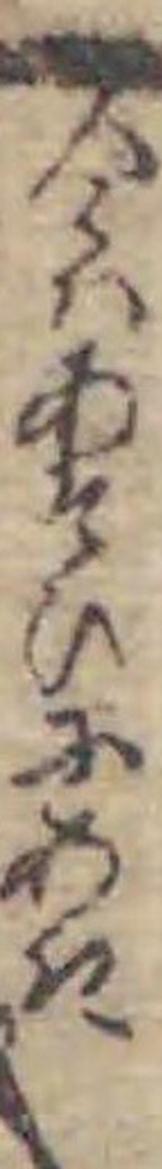今はあそひにあき
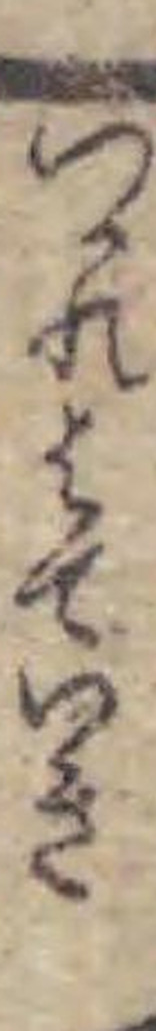つかれはていき
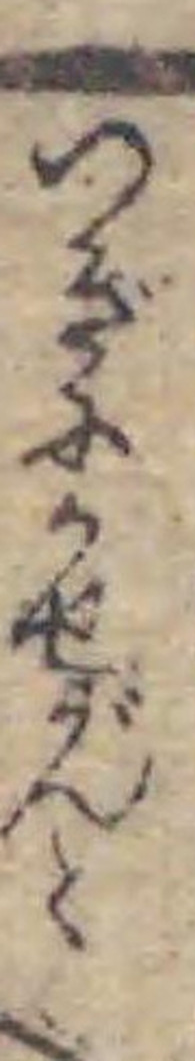つぎにかせがんと
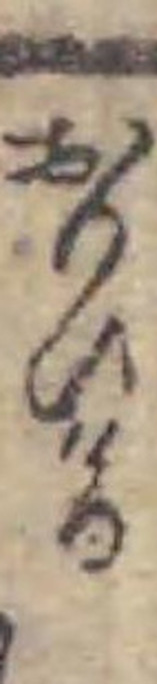おもひける
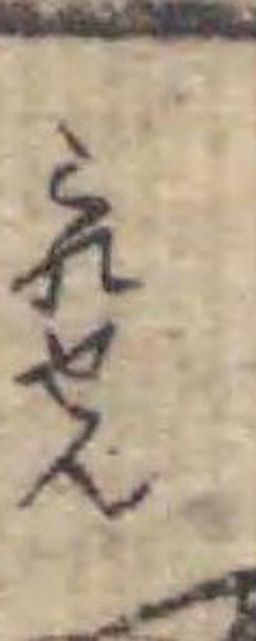これせん
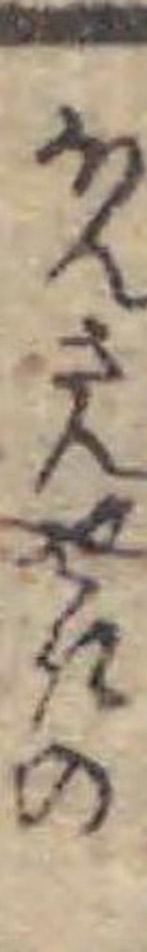ほんさんせきの
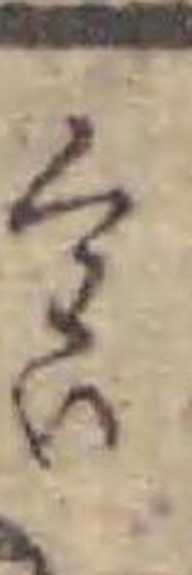くわい
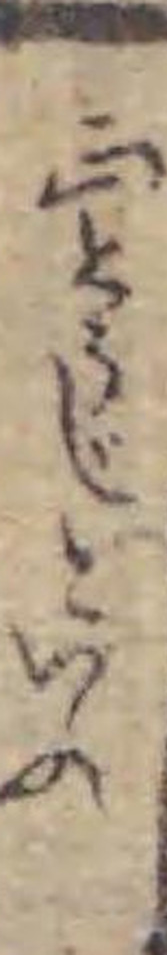正とうじといふ
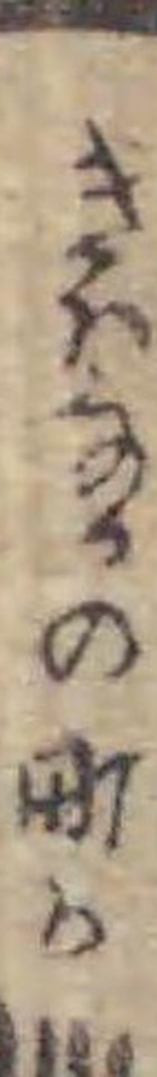きはなかの町か
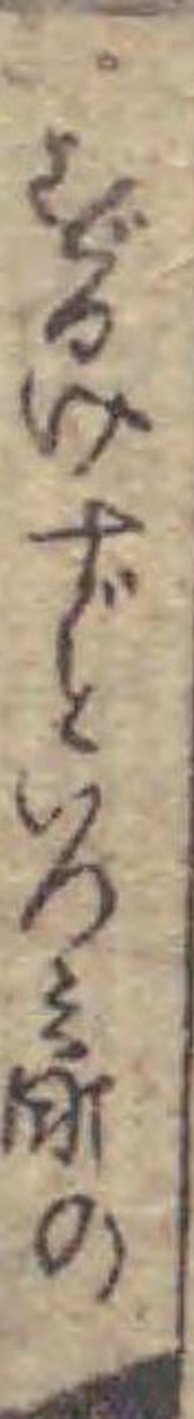ずるけずといつみ町の
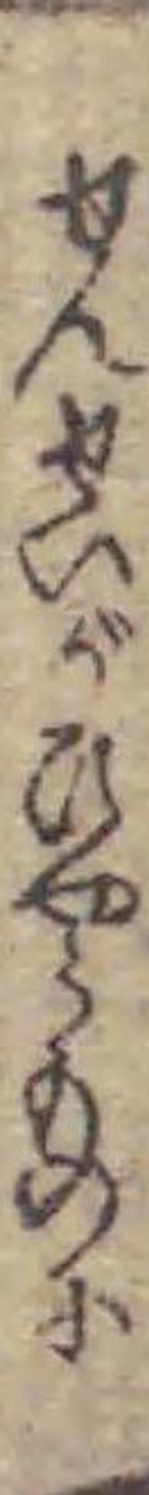せんせいがひやうものに
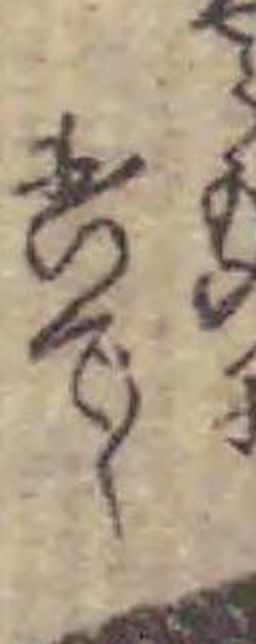おいで〳〵
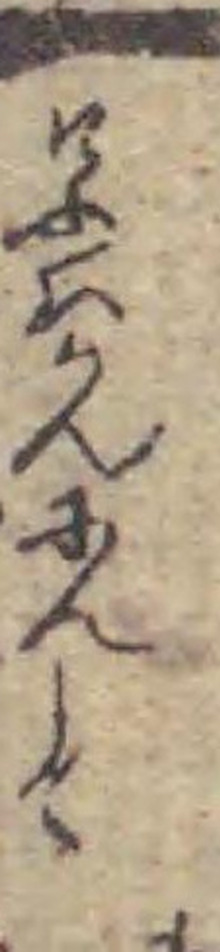けふはかんにんして
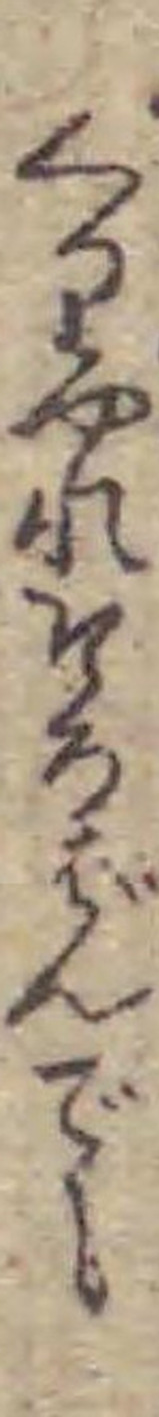くりやれそろばんでも
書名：威気千代牟物語 : 2巻
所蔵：国立国会図書館 National Diet Library, JAPAN
